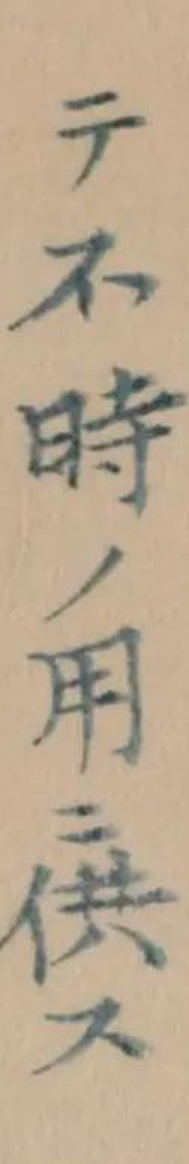テ不時ノ用ニ供ス

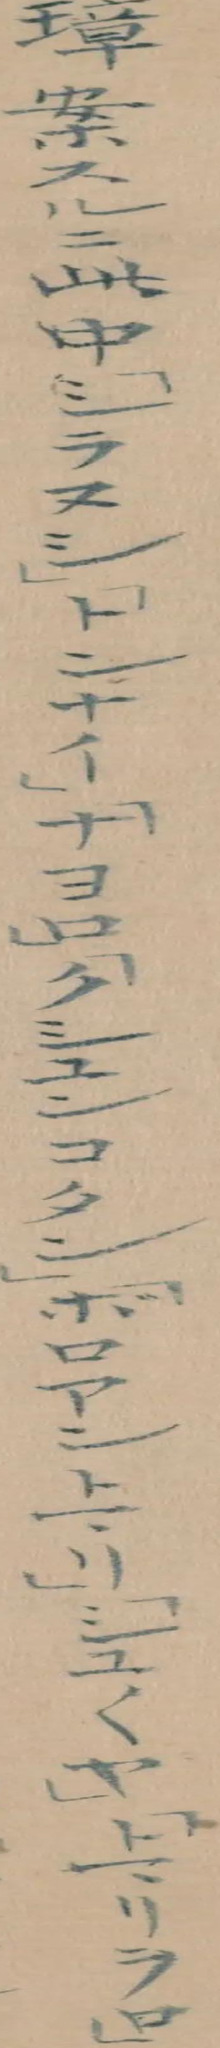璋案スルニ此中「シラヌシ」「トンナイ」「ナヨロ」「クシユンコタン」「ボロアントマリ」「シユ〱ヤ」「トマリヲロ」
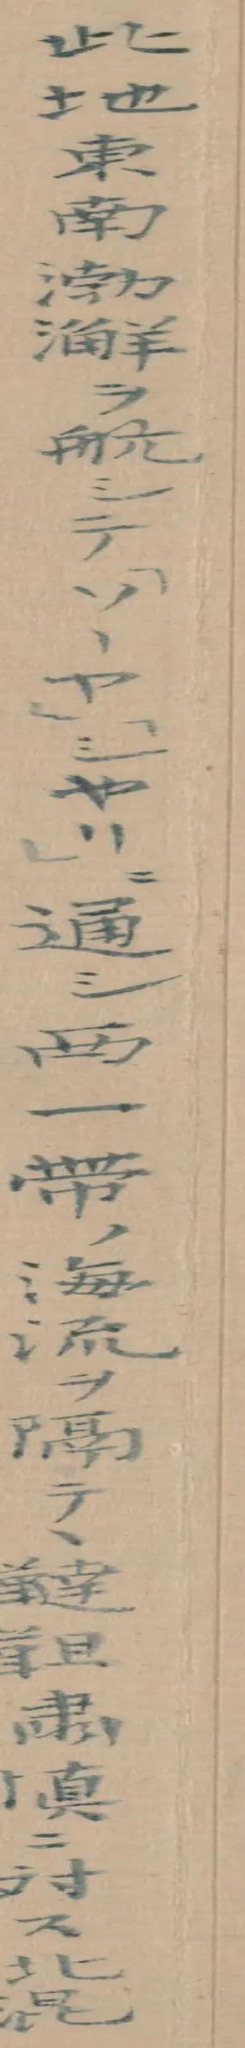此地東南渤澥ヲ航シテ「ソーヤ」「シヤリ」ニ通シ西一帯ノ海流ヲ隔テヽ韃靼粛慎ニ対ス北混
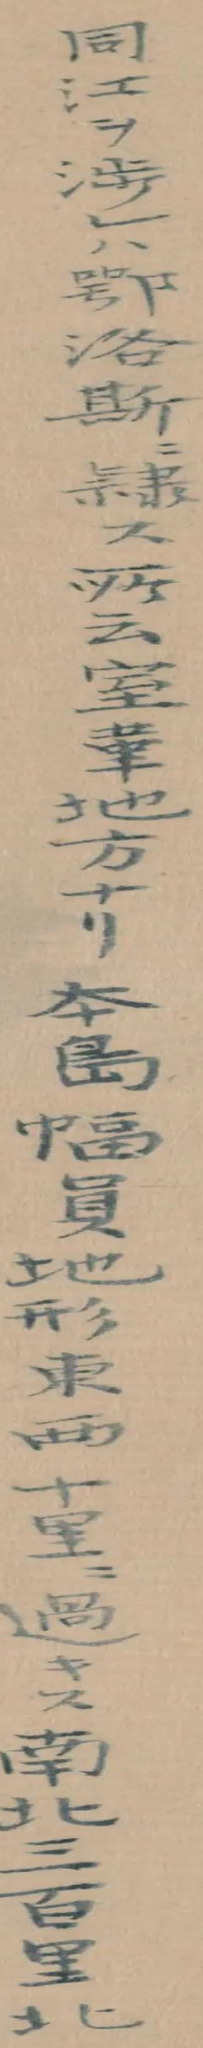同江ヲ渉レハ卾洛斯隷ス所云室韋地方ナリ本島幅員地形東西十里過キス南北三百里北
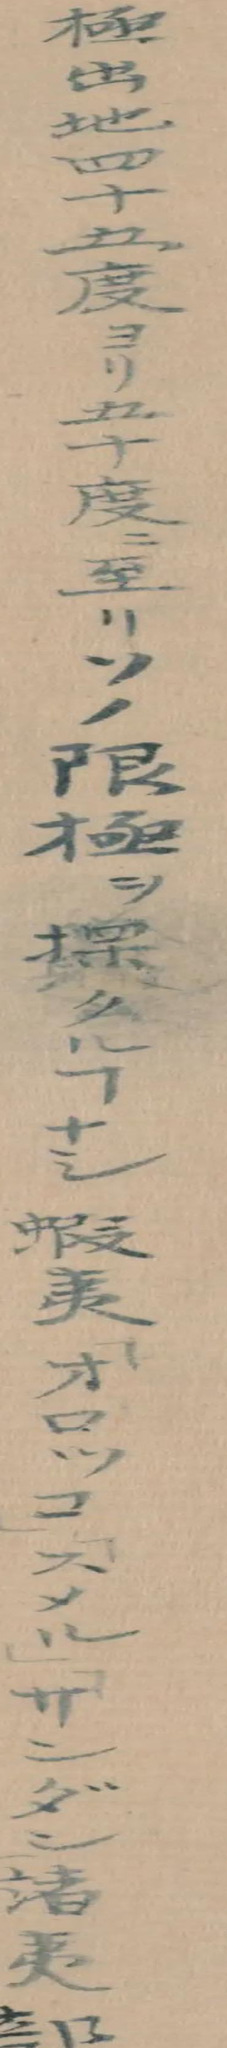極出地四十五度ヨリ五十度至リソノ限極ヲ探タルコトナシ蝦夷「オロッコ」「スメル」「サンダン」諸夷部
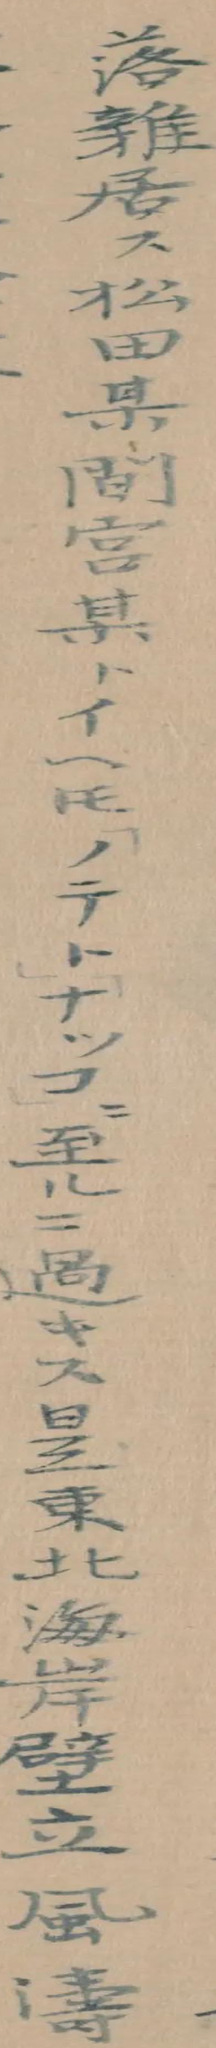落雑居ス松田某間宮某トイヘトモ「ノテト」「ナッコ」ニ至ルニ過キス是東北海岸壁立風濤
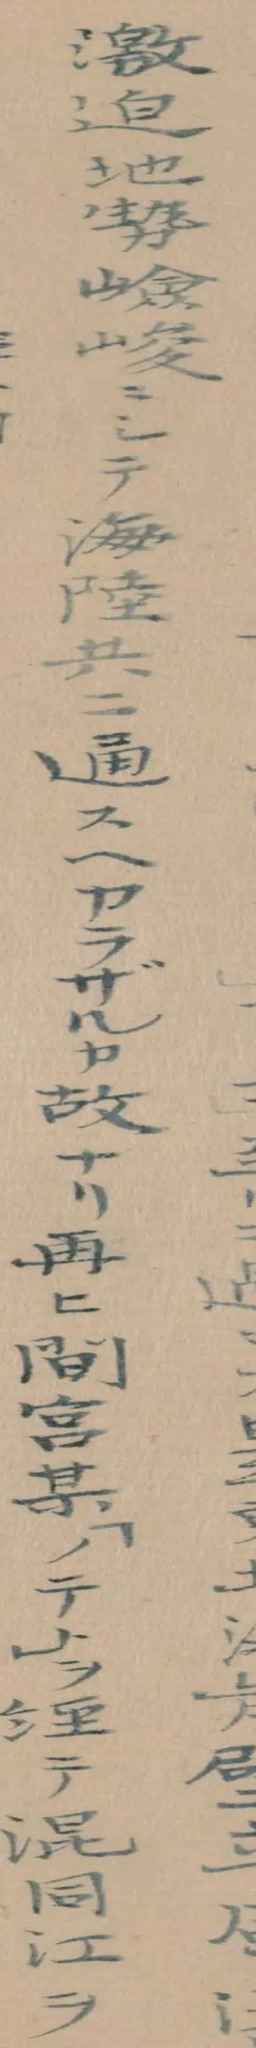激迫地勢嶮峻ニシテ海陸共ニ通スヘカラザルカ故ナリ再ヒ間宮某「ノテト」ヲ経テ混同江ヲ
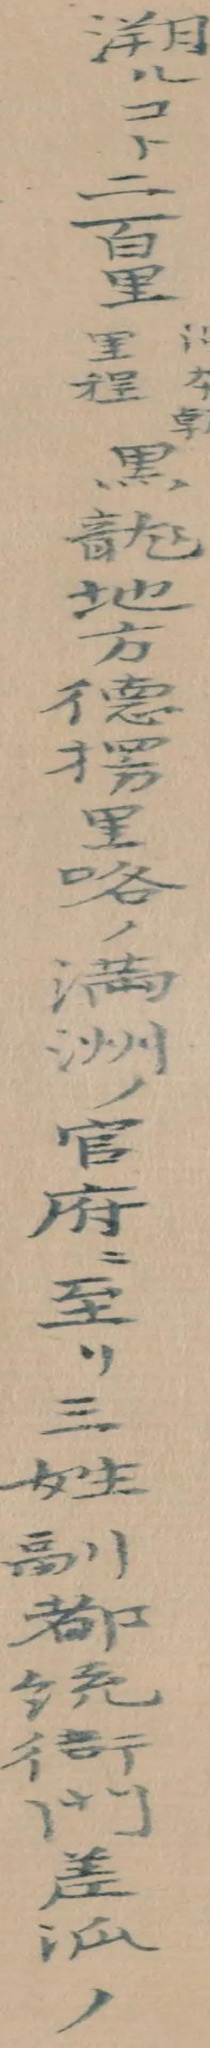溯ルコト二百里渾本朝里程黒龍地方徳楞里咯ノ満洲ノ官府至リ三姓副都統衙門差泒ノ
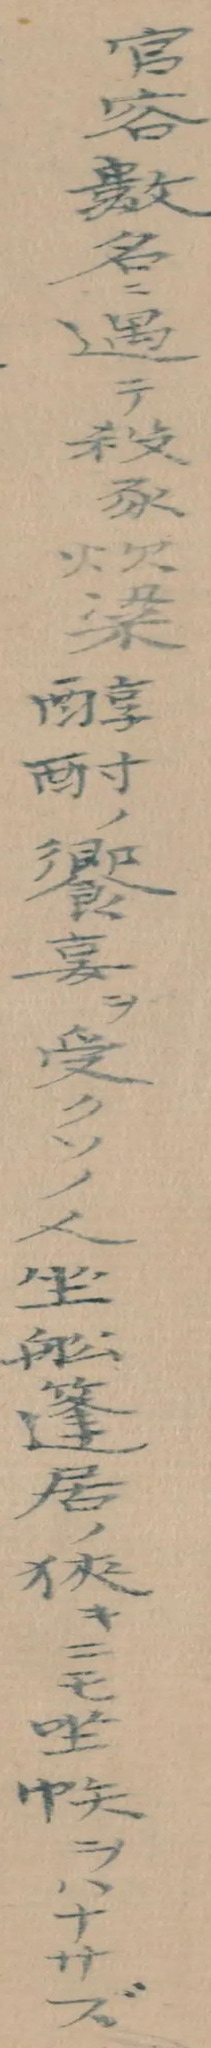官容数名ニ遇テ殺豕炊粱醇酎ノ饗宴ヲ受クソノ人座船篷居ノ狭キニモ座帙ヲハナサズ
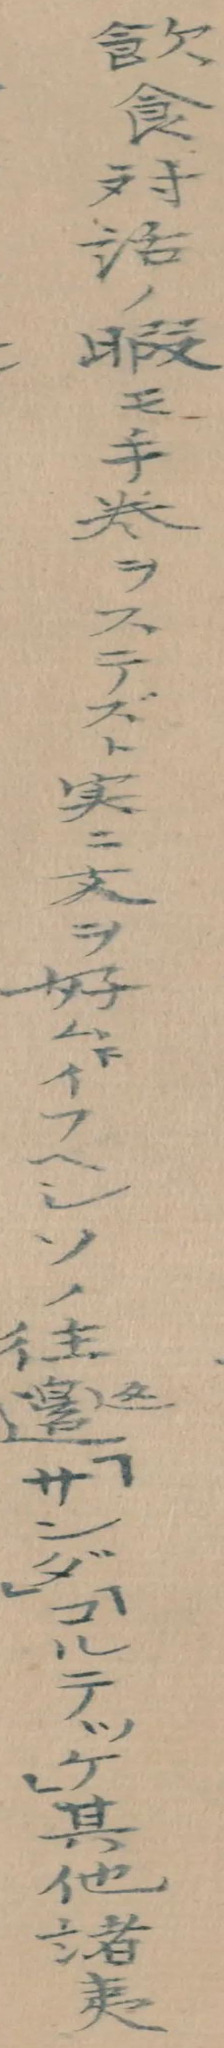飲食対話ノ暇モ手巻ヲステズト実ニ文ヲ好ムトイフヘシソノ往邉「サンダ」「コルテッケ」其他諸夷
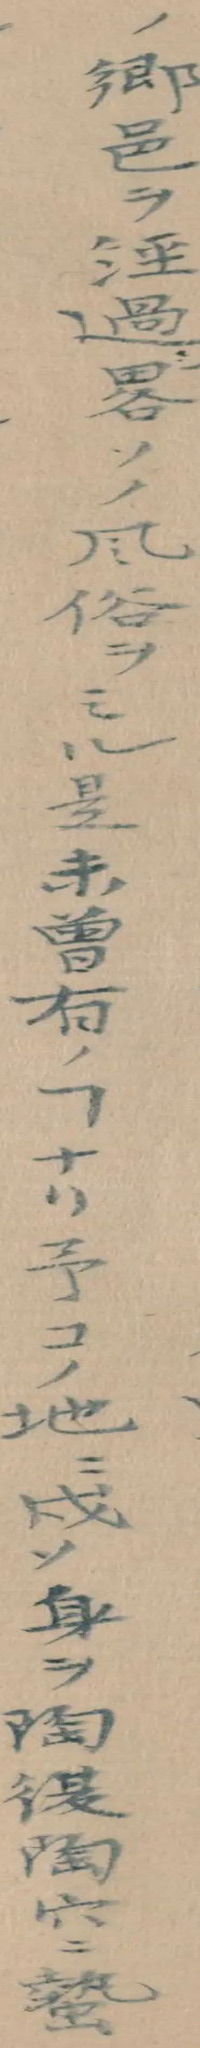ノ郷村ヲ経過略ソノ風俗ヲミル是未曾有ノコトナリ予コノ地戍シテ身ヲ陶復陶穴ニ蟄
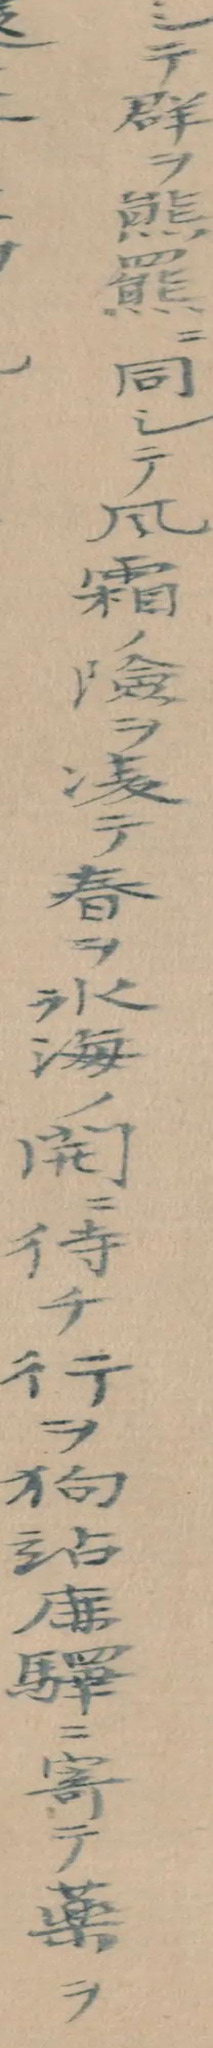シテ群ヲ熊羆同シテ風霜ノ険ヲ凌テ春ヲ氷海ノ開待チ行ヲ狗站鹿駅ニ寄テ薬ヲ
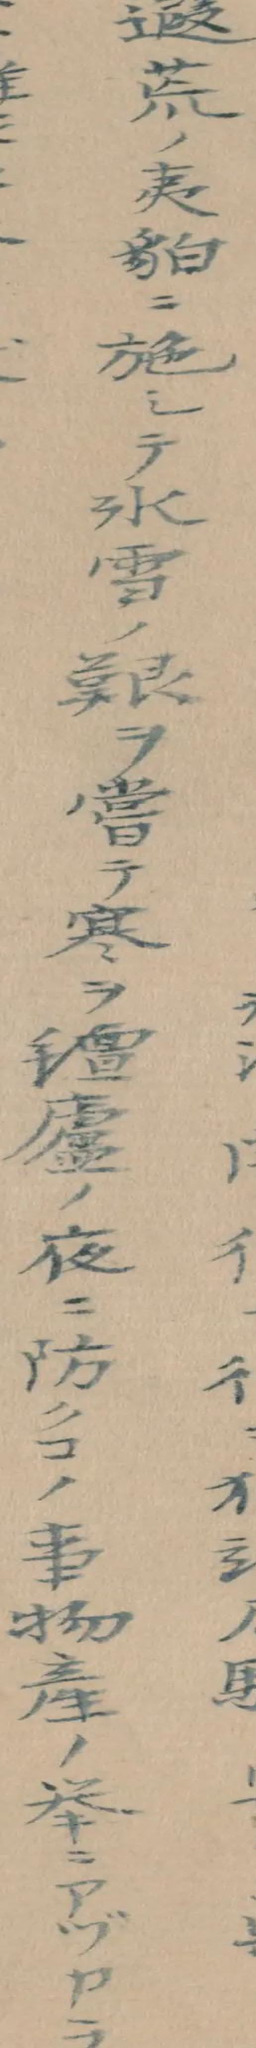遐荒ノ夷貊ニ施シテ氷雪ノ艱ヲ嘗テ寒ヲ氈廬ノ夜ニ防クコノ事物産ノ挙ニアズカラ
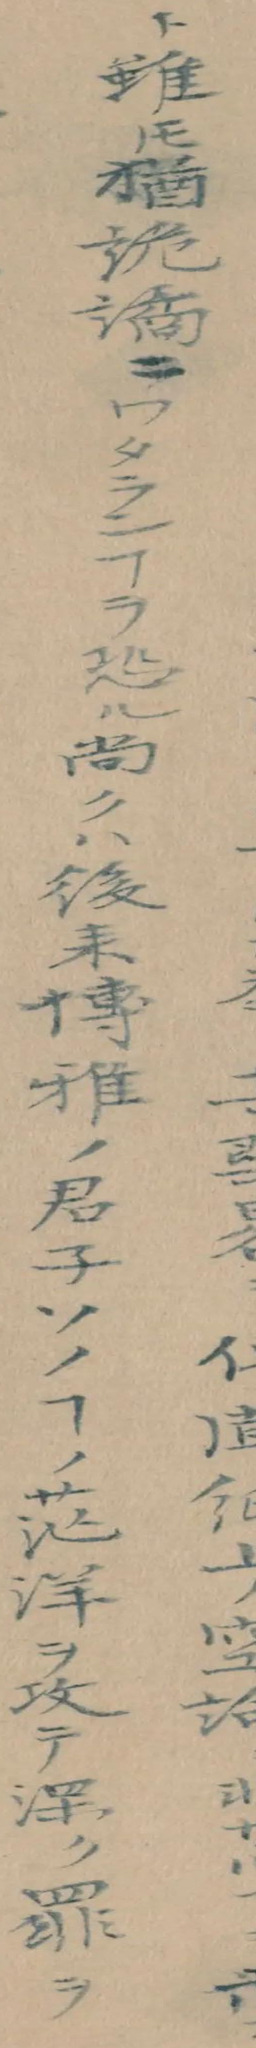ト雖トモ猶詭譎ニワタランコトヲ恐ル尚クハ後来博雅ノ君子ソノコトノ茫洋ヲ攻テ深ク罪ヲ
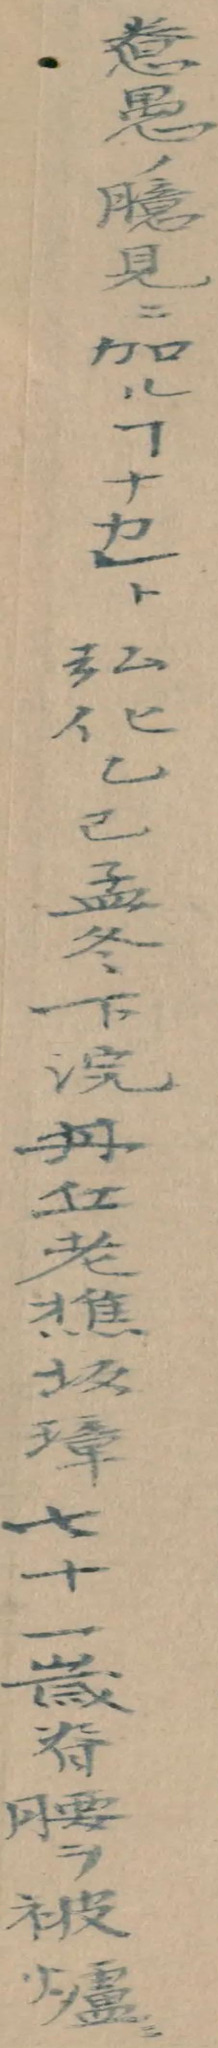惷愚ノ臆見ニく加ルコトナカレト弘化乙巳孟冬下浣丹丘老樵坂璋七十一歳脊腰ヲ被爐
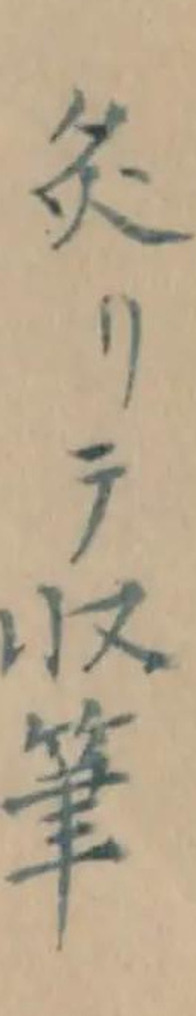炙リテ収筆
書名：蝦夷草木図
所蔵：国立国会図書館 National Diet Library, JAPAN
